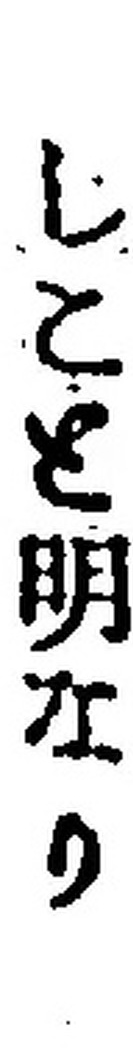しこと明なり
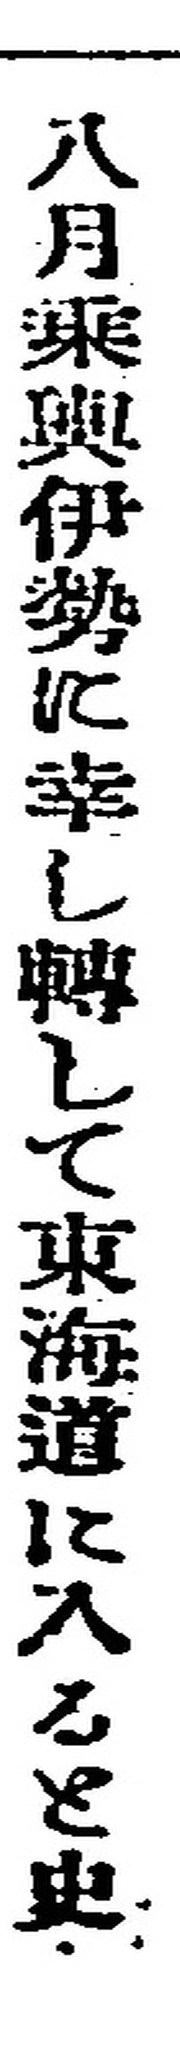八月乗輿伊勢に幸し転して東海道に入ると史
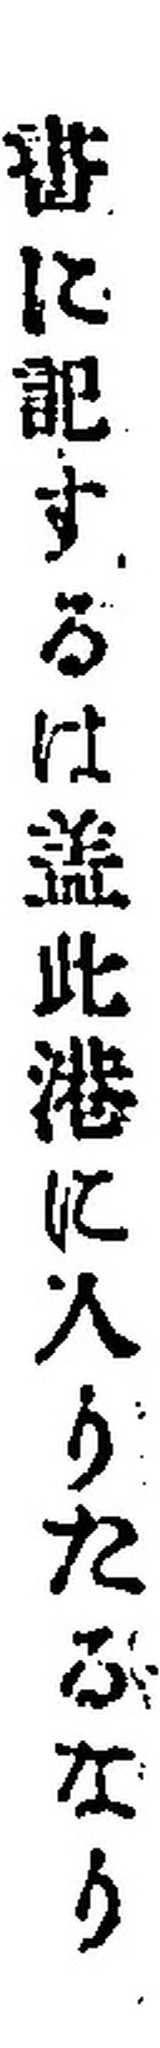書に記するは蓋此港に入りたるなり
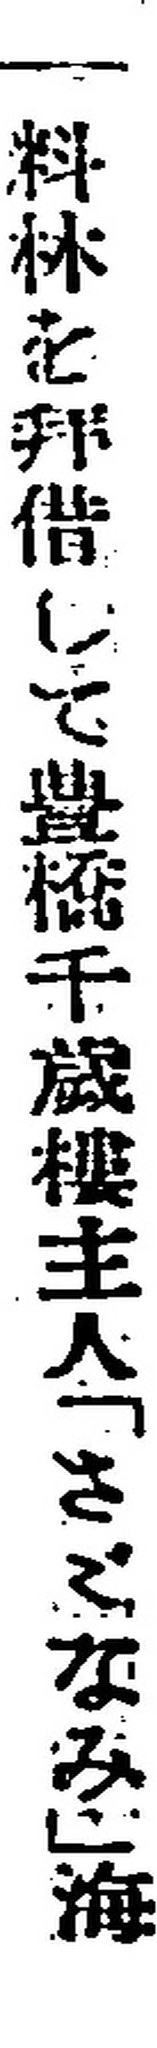料林を拝借して豊橋千歳楼主人「さゞなみ」海
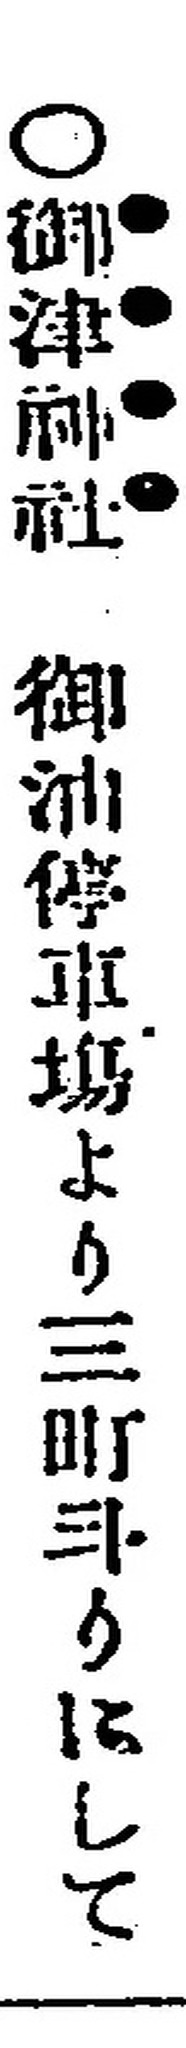○御津神社御油停車場より三町斗りにして
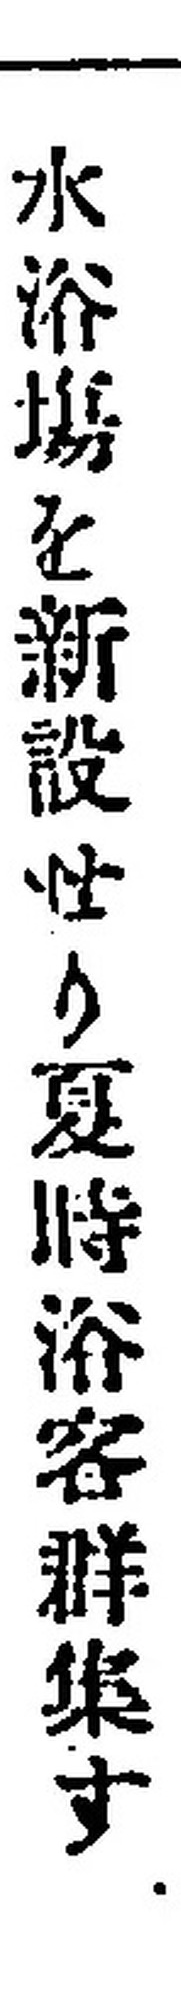水浴場を新設せり夏時浴客群集す
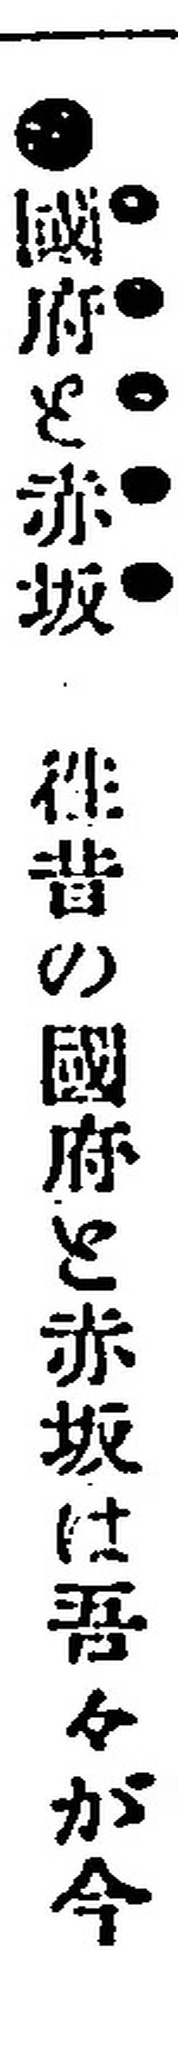●国府と赤坂往昔の国府と赤坂は吾々が今
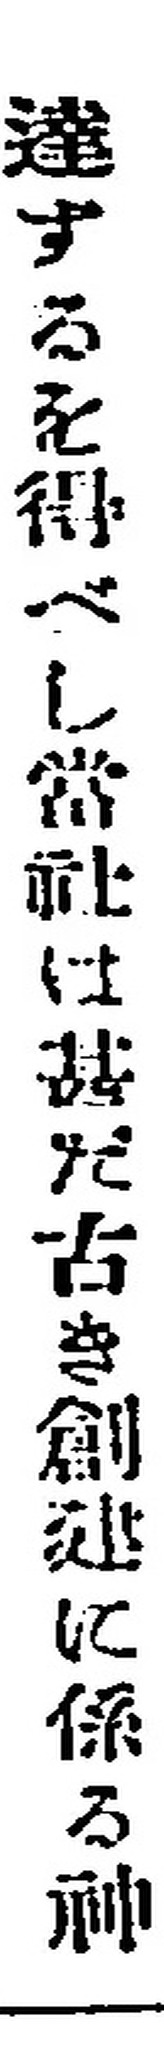達するを得べし当社は甚だ古き創建に係る神
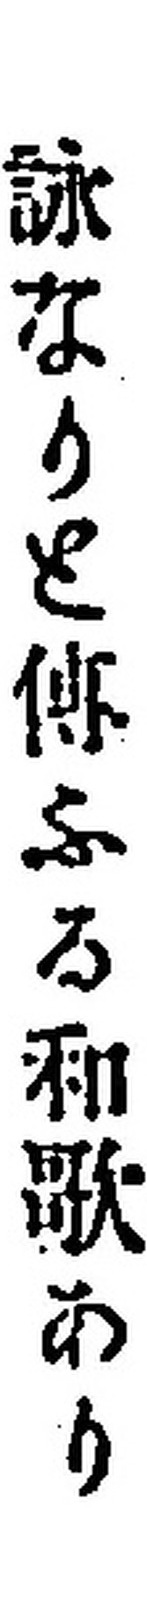詠なりと伝ふる和歌あり
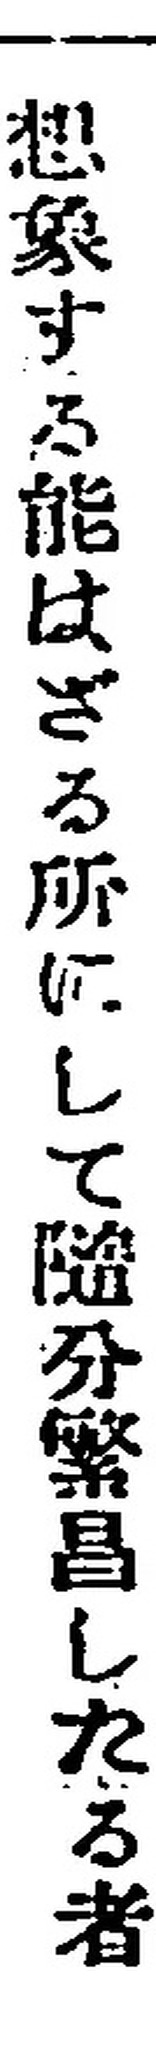想象する能はざる所にして随分繁昌したる者
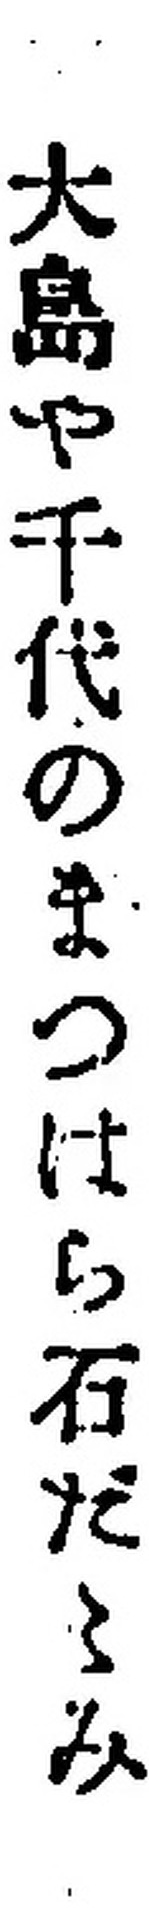大島や千代のまつはら石だゝみ
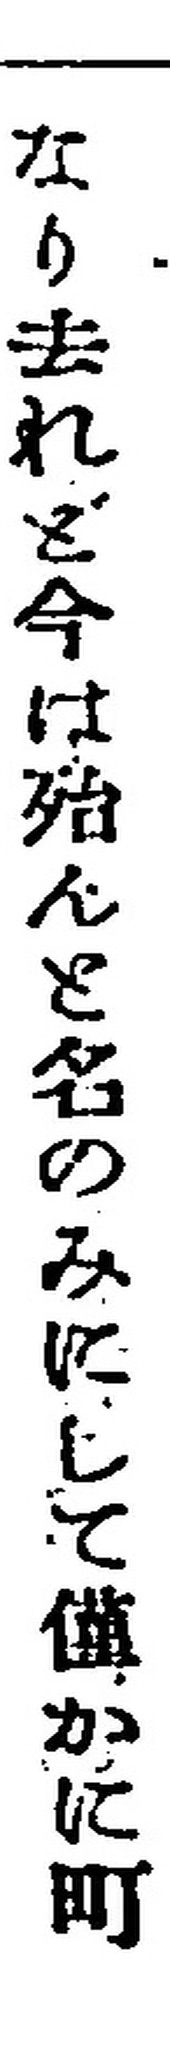なり去れど今は殆んと名のみにして僅かに町
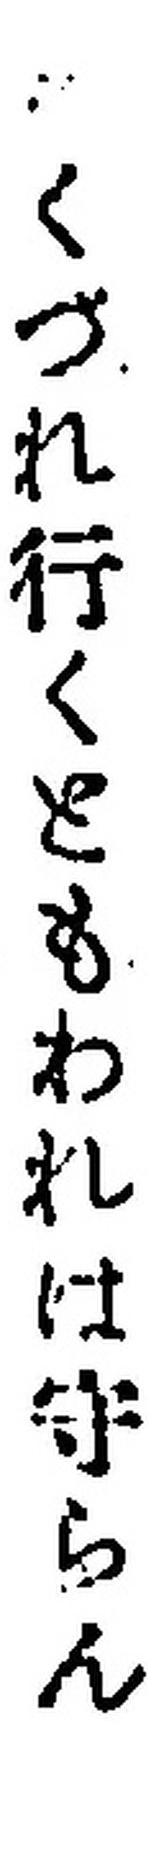くづれ行くともわれは守らん
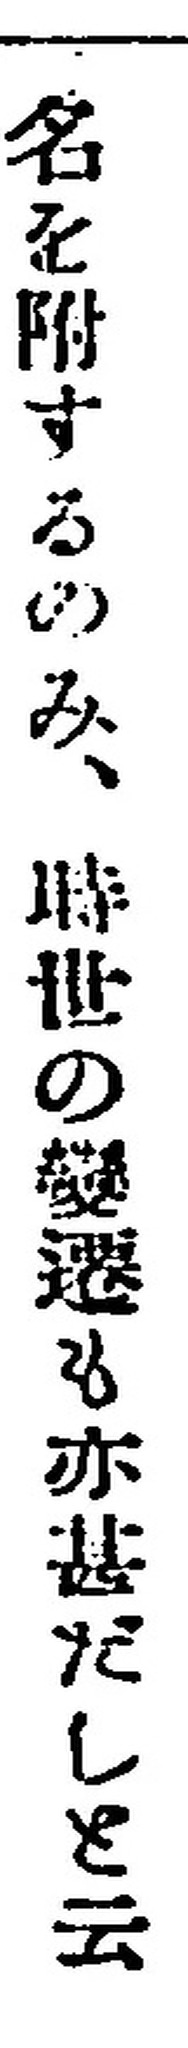名を附するのみ、時世の変遷も亦甚だしと云
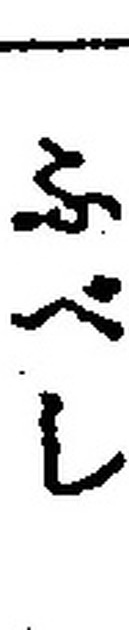ふべし
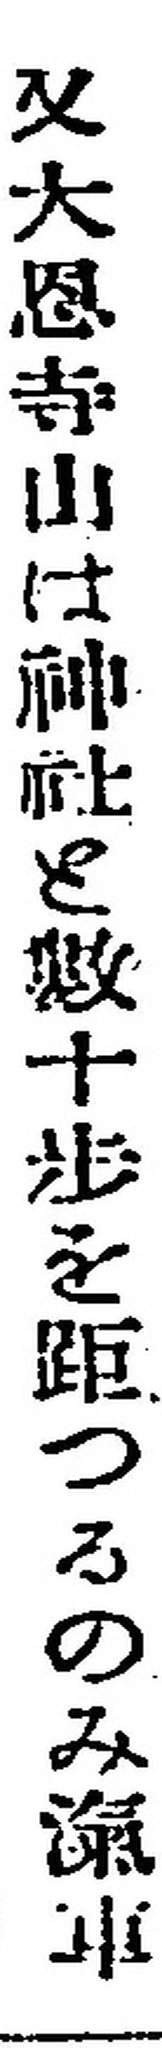又大恩寺山は神社と数十歩を距つるのみ汽車
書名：東参名勝案内
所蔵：国立国会図書館 National Diet Library, JAPAN
